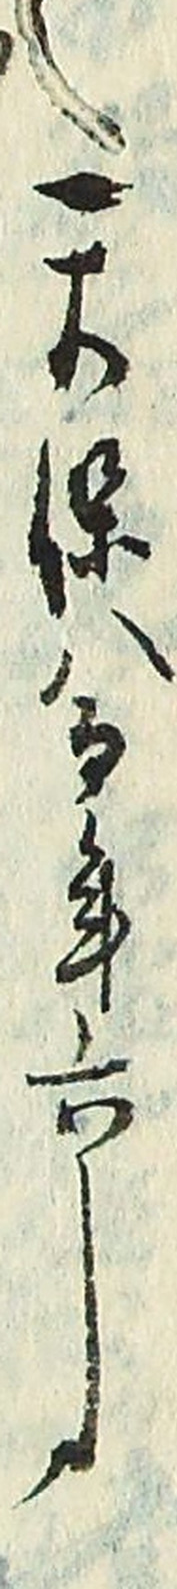天保八酉年六月
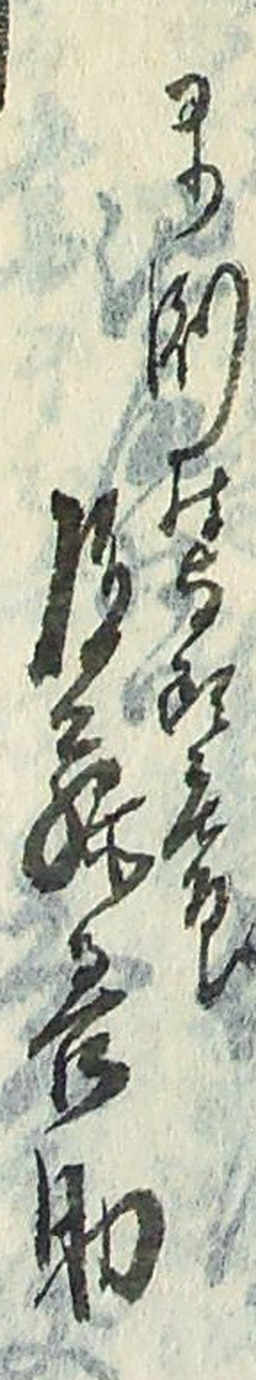後藤善助
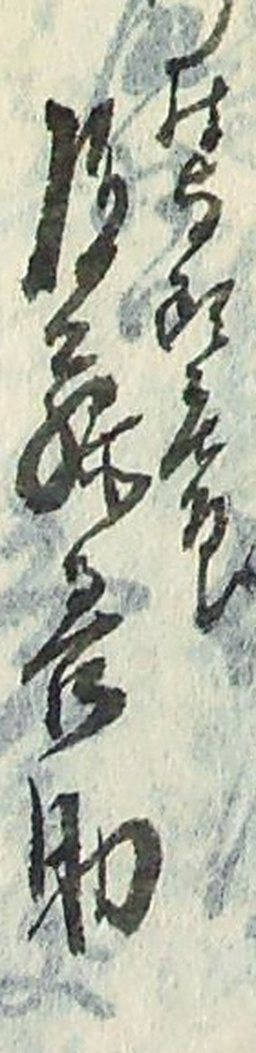後藤善助
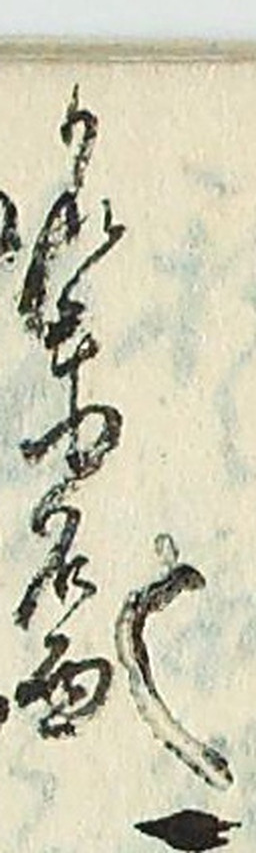名東名西
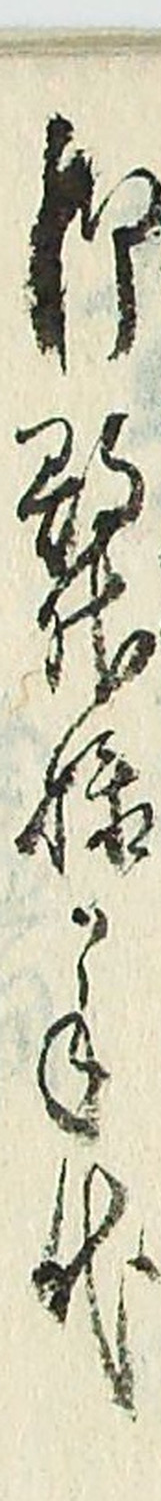御郡代様御手代
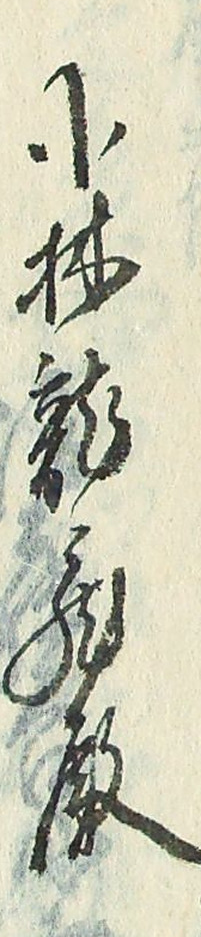小林龍蔵殿

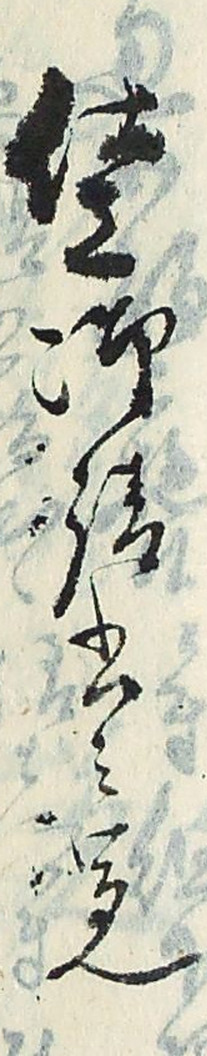仕上御請書之覚
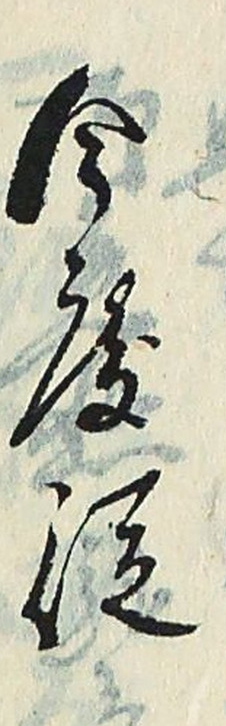今度従
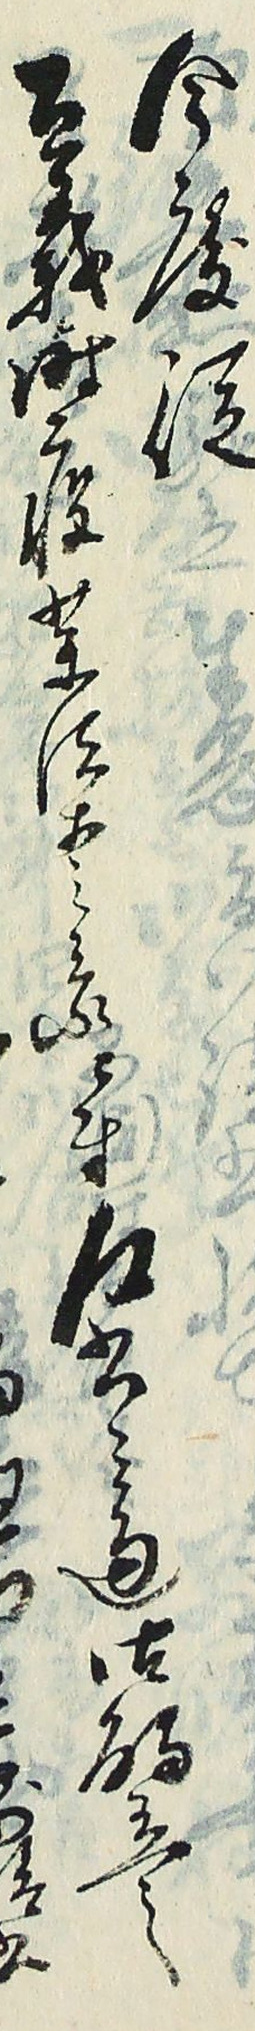公義時疫薬法等之義に付左書之通御触有之
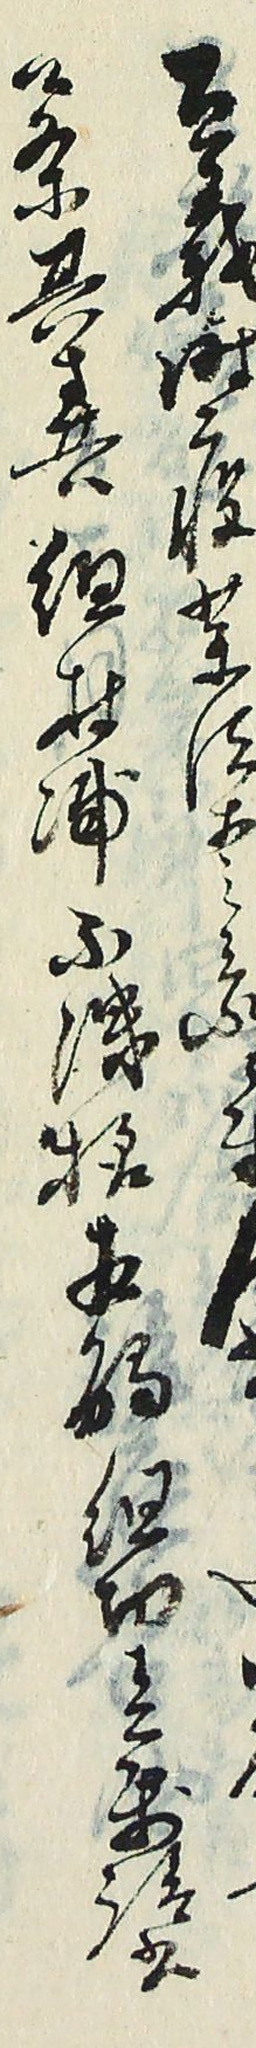候条其方共組村浦不洩様相触組切壱帋請書
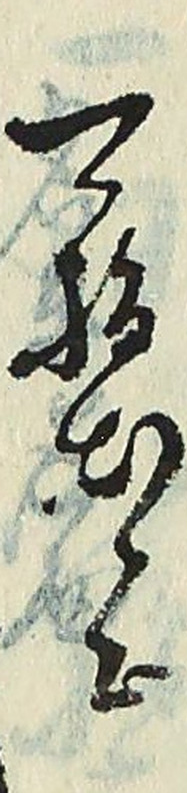可指出候以上
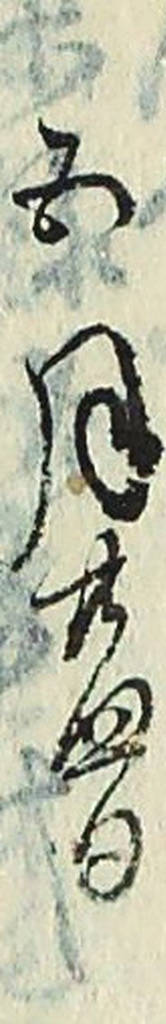五月廿四日
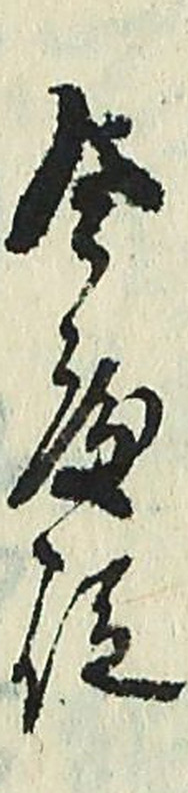今度従
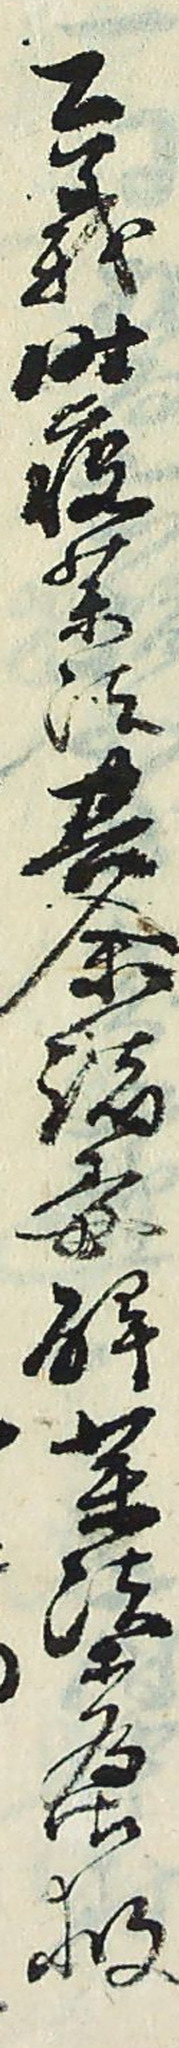公義時疫薬法其余諸毒解薬法等為御救
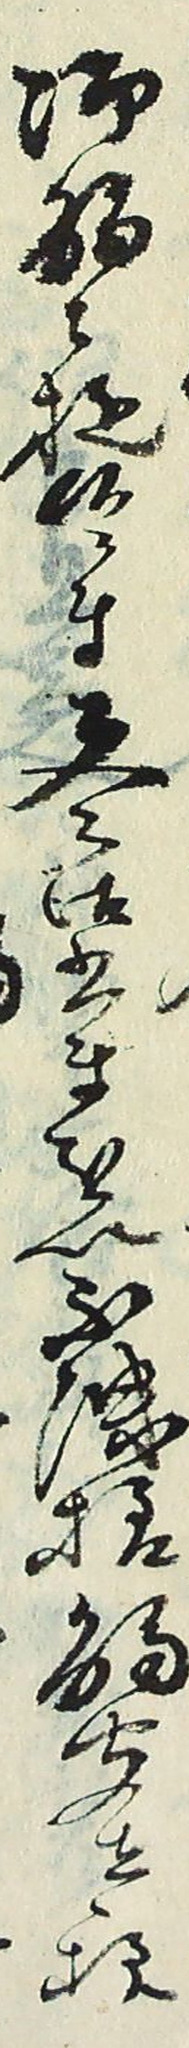御触被遊候に付夫々御書付を以不洩様触聞せ候様
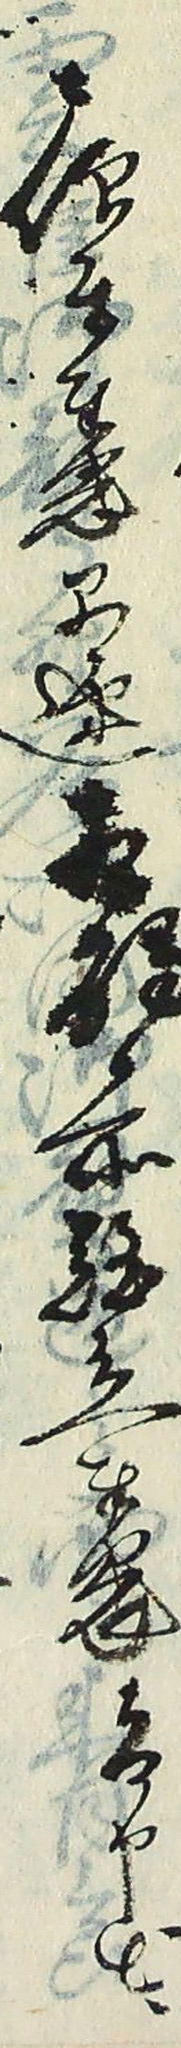被仰付奉畏早速相触候所難有奉畏旨申出候
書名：諸御用御□受書控
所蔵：鳴門教育大学 Naruto University of Education
